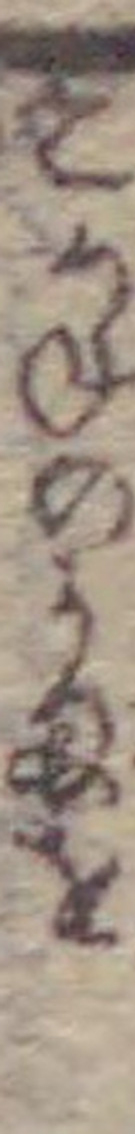こかねのかまを
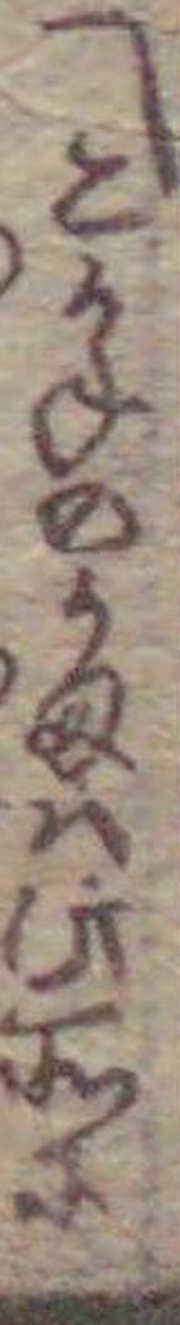〽こかねのかまは此所に
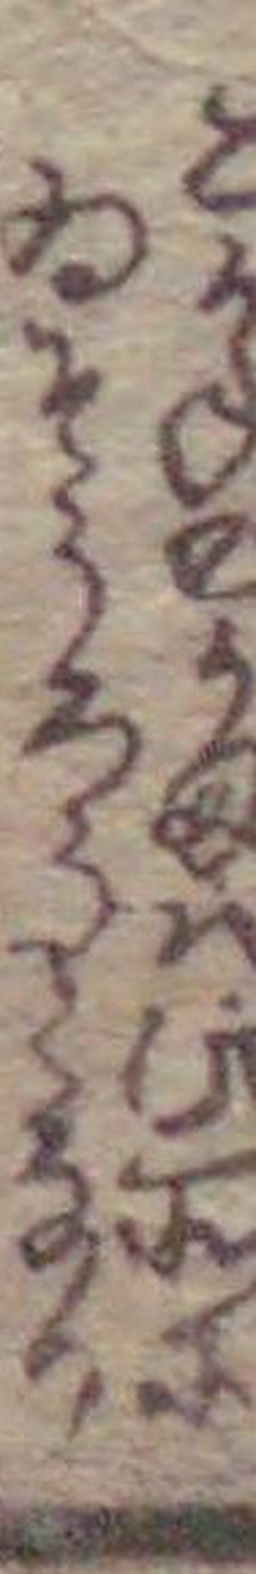ゐそうろうとなり
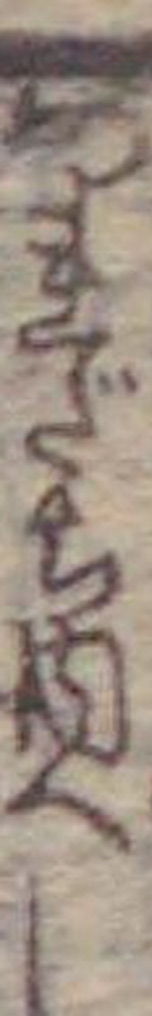つれだち内へ
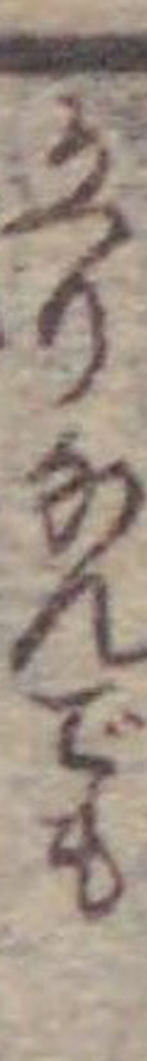かへりなんでも
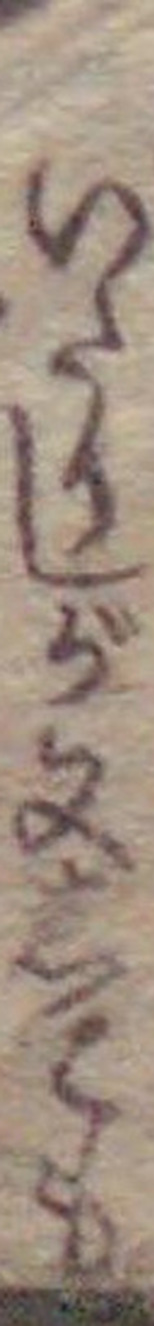いたりしが又しても
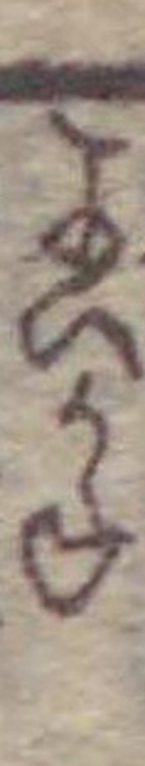よいかね
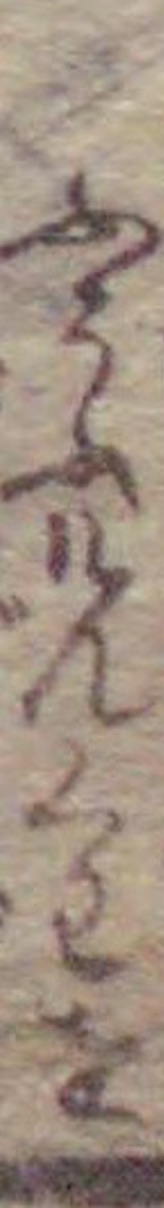ふうふけんくわを
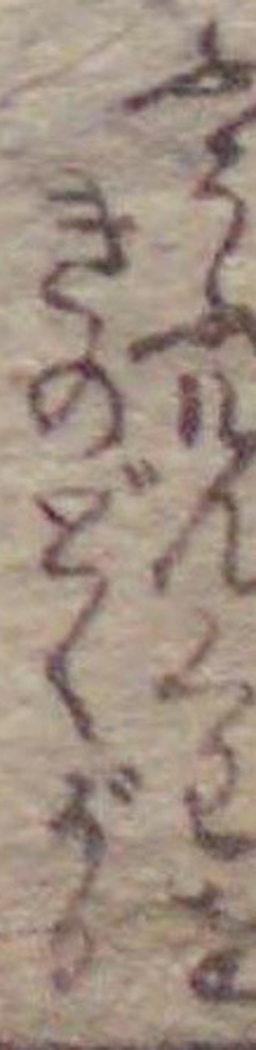きのどくがる
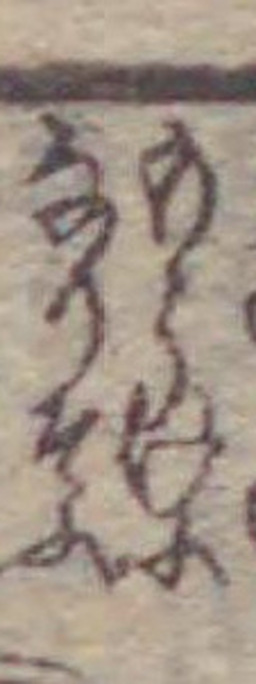なりそふ
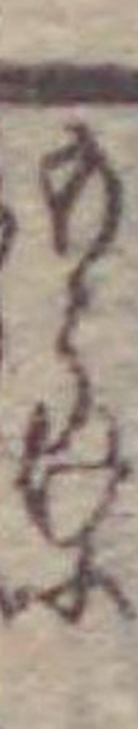もうけに
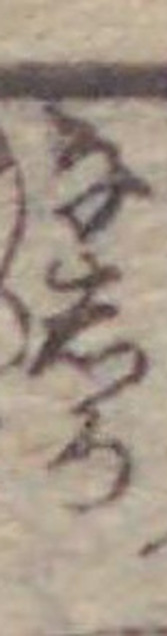なしろ
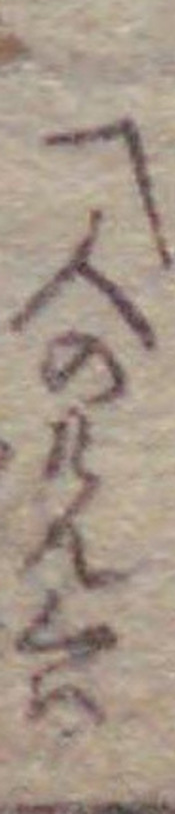〽人のけんくは
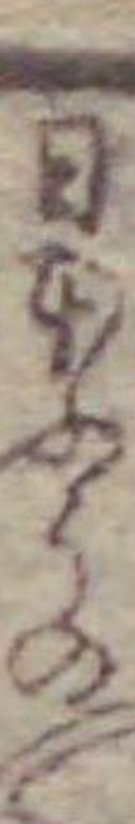日本ふうの
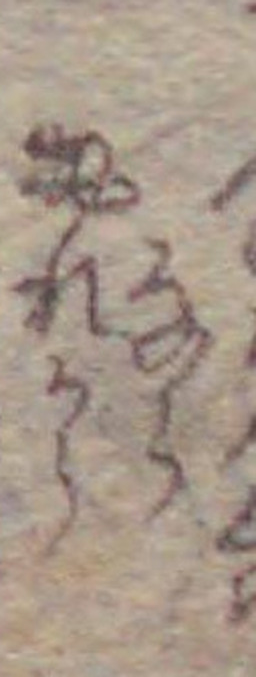おれから
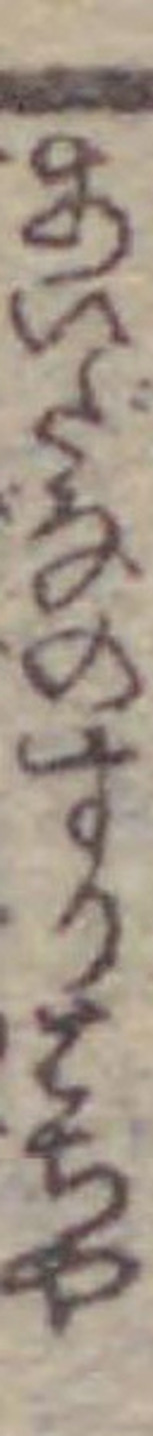あいだなのすりはちや
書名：万物小遣帳 : 2巻
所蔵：国立国会図書館 National Diet Library, JAPAN
